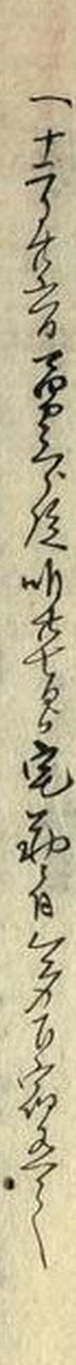一十二月廿六日勇三郎殿明廿七日ゟ宅勤ニ付今夕下宿有之
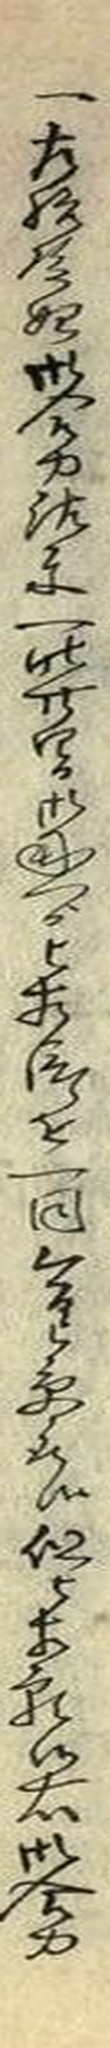一左膳殿始御合力銀米一昨廿四日御用人ゟ被相渡候を一同今日被受取候但被相願候右御合力
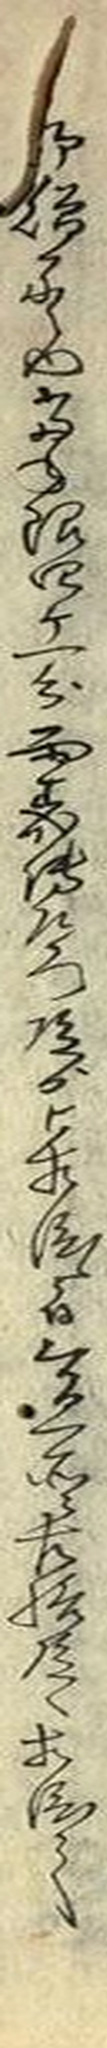御贈米之内当年限四ケ一分雨森伝左衛門殿ゟ被相渡候ニ付今日一所ニ左膳殿へ相渡之
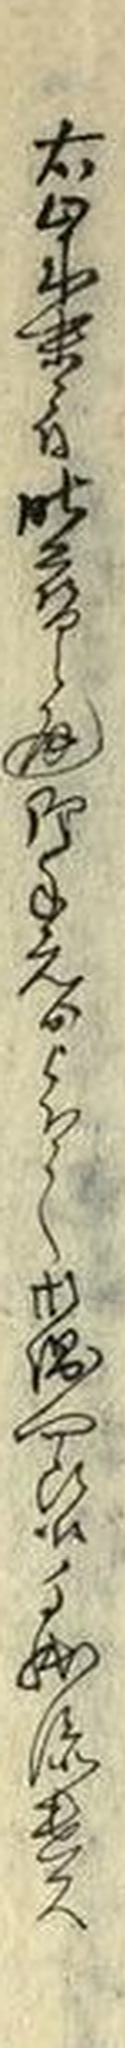右歳末ニ付昨暮之通御手元ゟ被下之御側向頭取手紙添遣ス
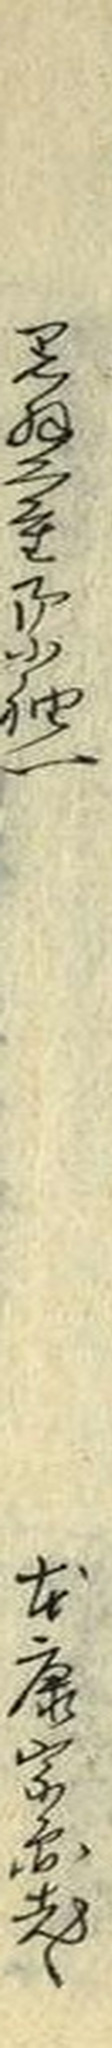黒羽二重御小袖一本康宗円老へ
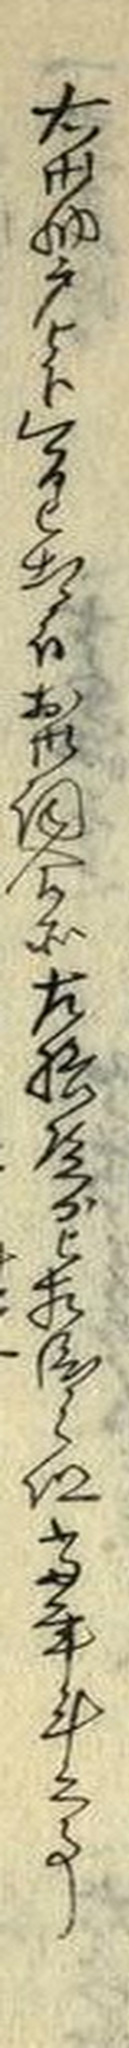右御納戸被下今日被出候ニ付於御調合所左膳殿ゟ被相渡候但当年斗之事
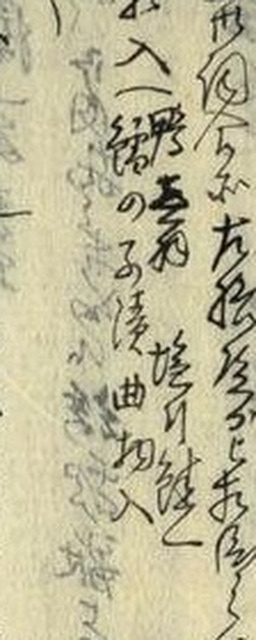鱈の子漬曲物入
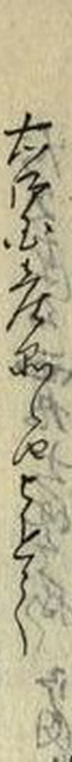右御国産品之由被進之

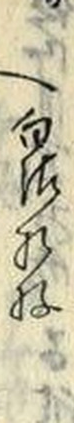白銀五枚
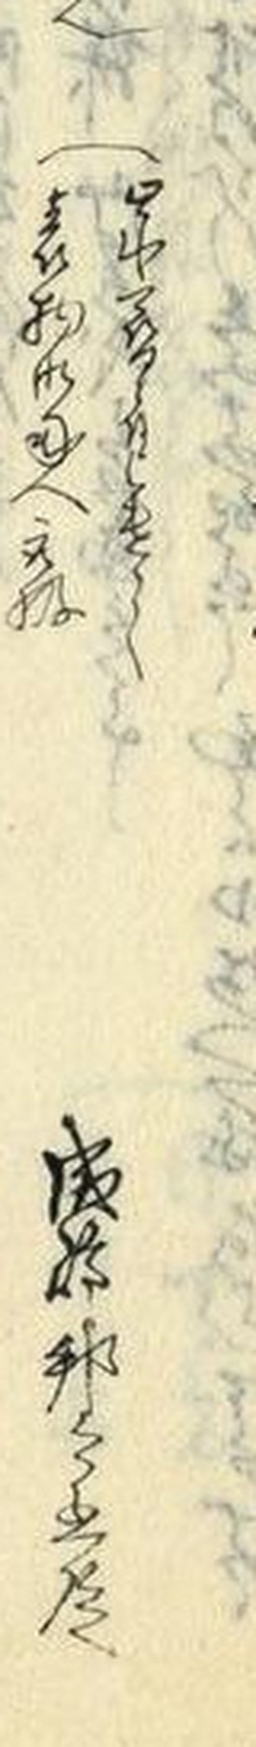表物御用人取扱成嶋邦之丞殿
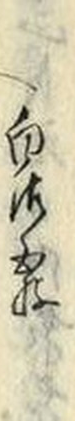白銀五枚
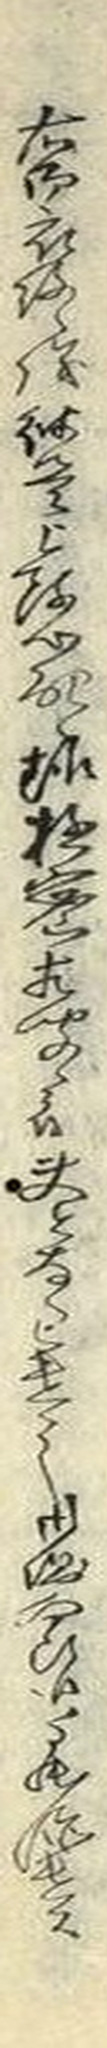右御衣役之儀彼是被致心配候趣極密相聞候ニ付夫となく被遣之御側向頭取手紙添遣ス
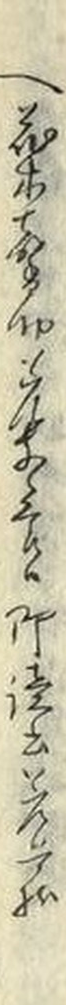花木馨助差支候節ハ御読書差上候様
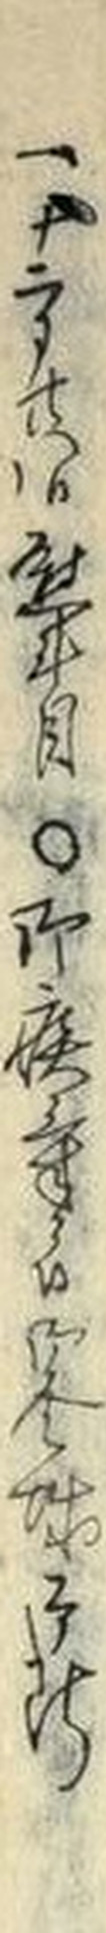一十二月廿八日熨斗目〇御疾気ニ付御登城御断
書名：少傅日録抄（斉善付側向頭取日記、在府）
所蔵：福井県文書館 Fukui Prefectural Archives
